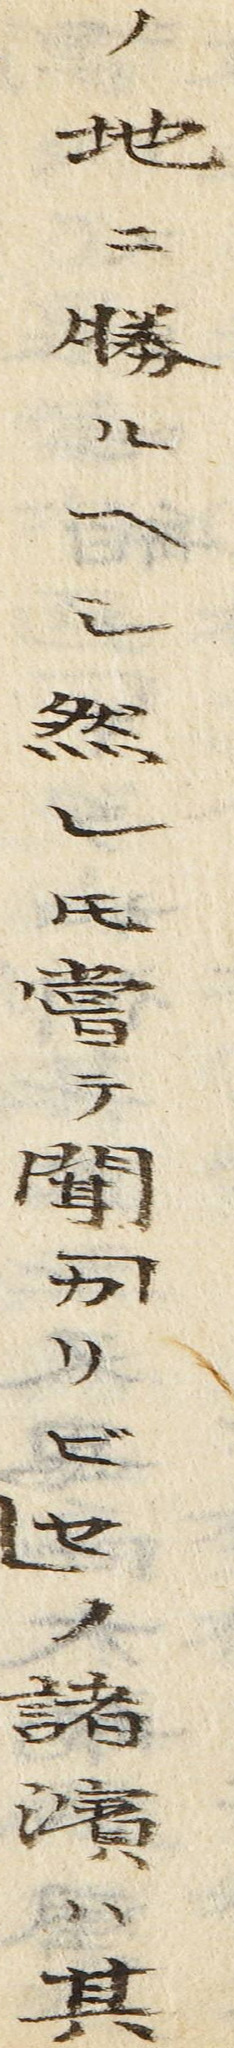ノ地ニ勝ルヘシ然レトモ嘗テ聞「カリビセ」ノ諸浜ハ其
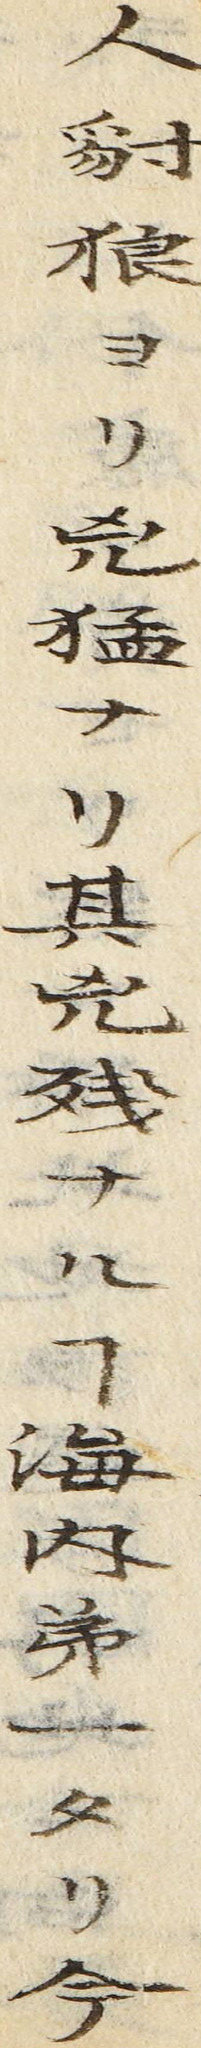人豺狼ヨリ兇猛ナリ其兇残ナルコト海内第一タリ今
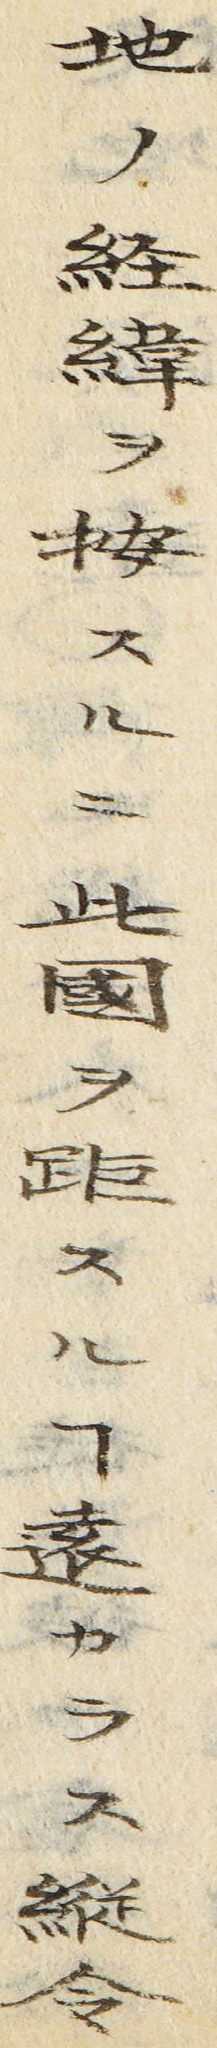地ノ経緯ヲ按スルニ此国ヲ距スルコト遠カラス縦令

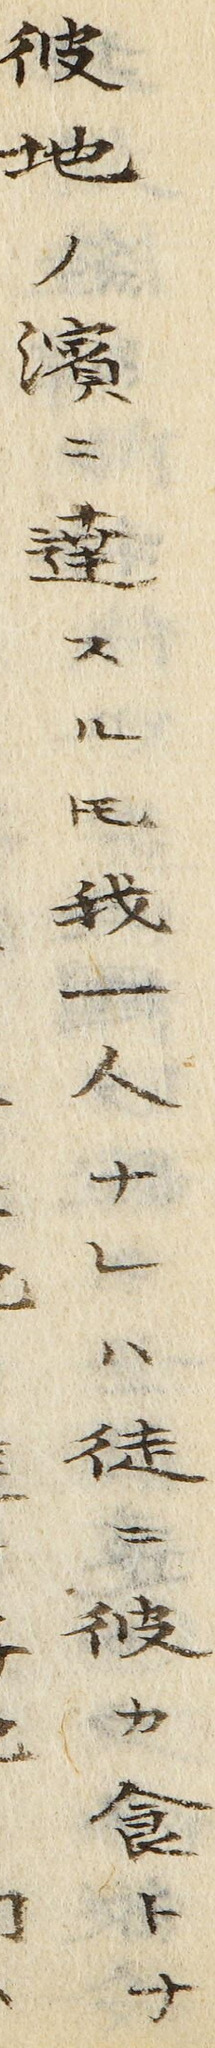彼地ノ浜ニ達スルトモ我一人ナレハ徒ニ彼カ食トナ
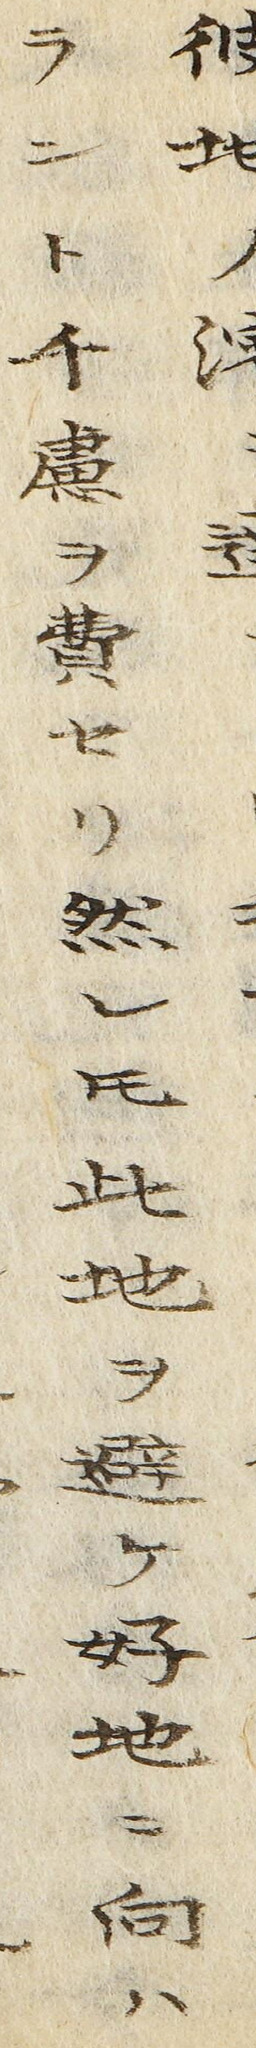ラント千慮ヲ費セリ然レトモ此地ヲ避ケ好地ニ向ハ
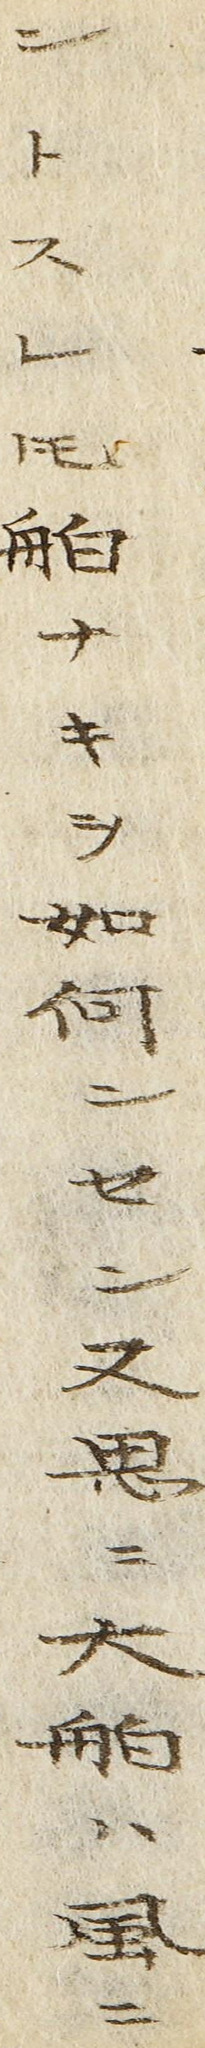ントスレトモ舶ナキヲ如何ンセン又思ニ大舶ハ風ニ
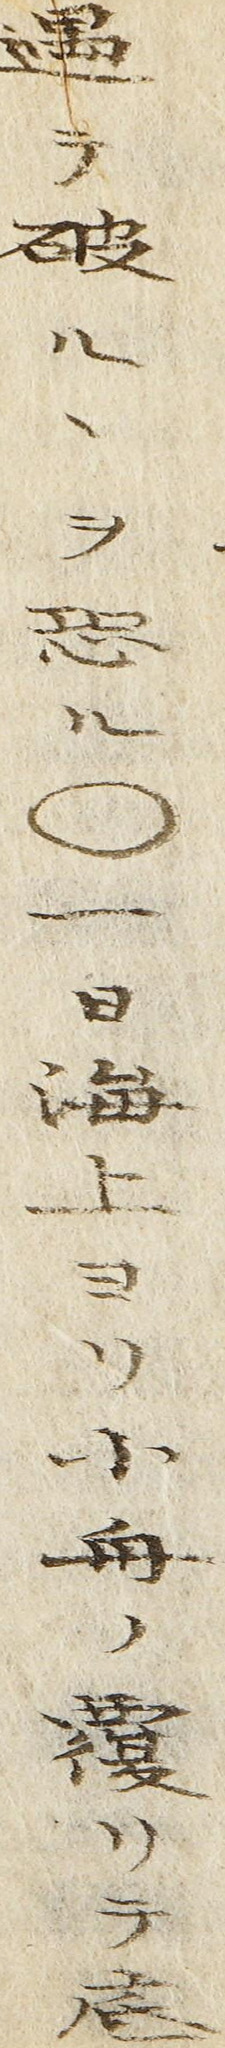遇テ破ルヽヲ恐ル◯一日海上ヨリ小舟ノ覆リテ底
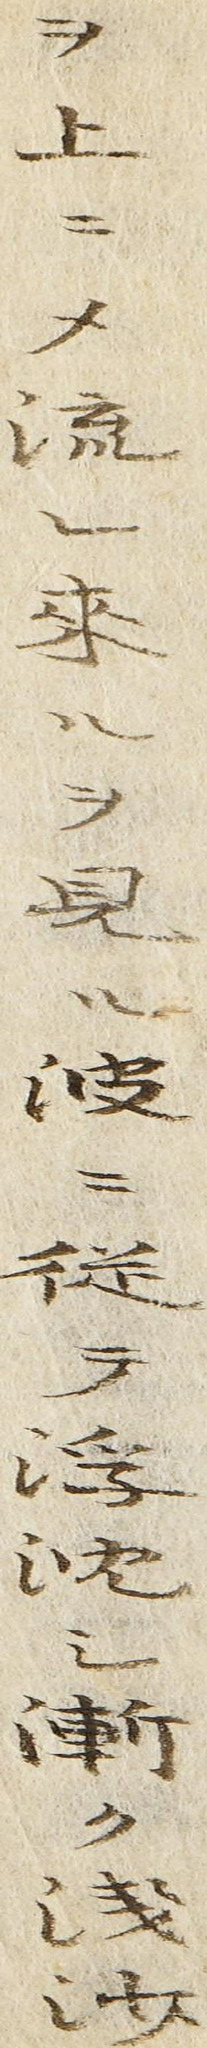ヲ上ニシテ流レ来ルヲ見ル波ニ従テ浮沈シ漸ク浅沙
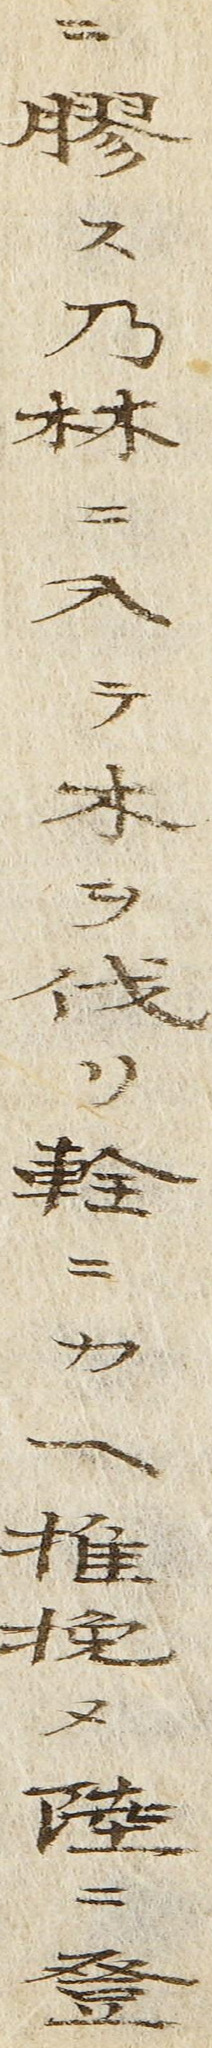ニ膠ス乃林ニ入テ木を伐リ輇ニカヘ推挽シテ陸ニ登
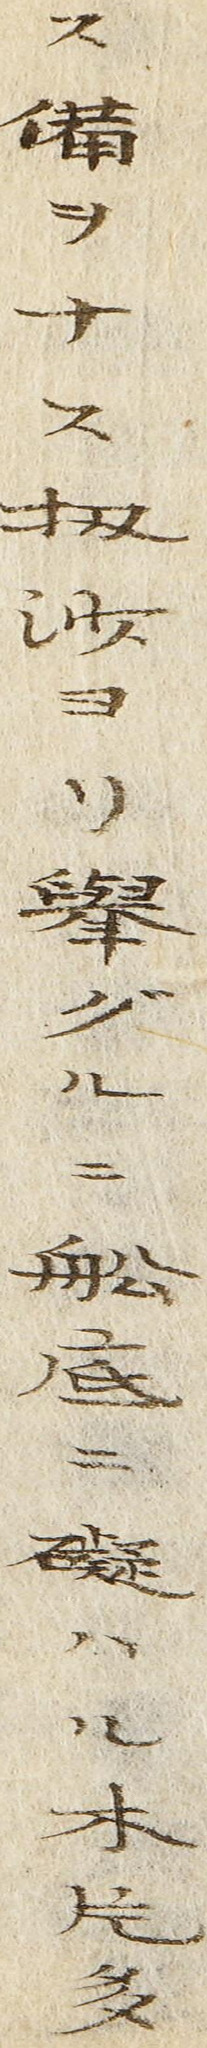ス備ヲナス扨沙ヨリ挙グルニ船底ニ礙ハトル木片多
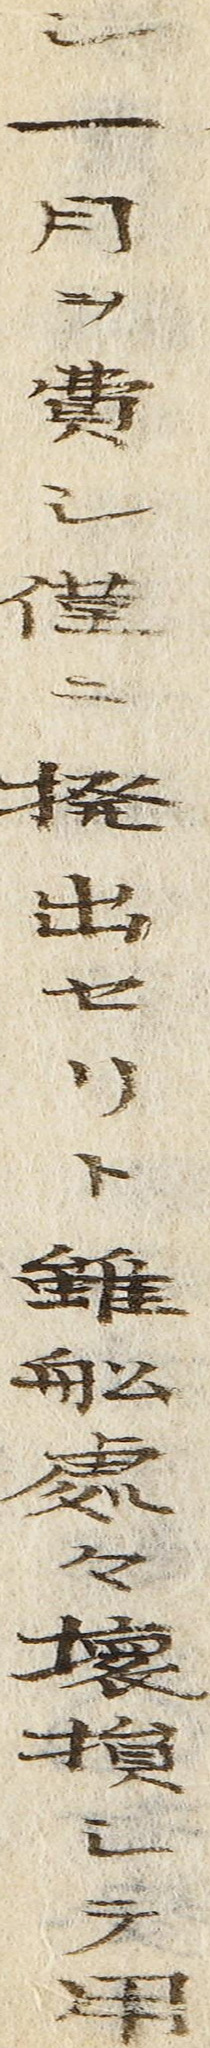シ一月ヲ費シ僅ニ撥出セリト雖船処々壊損シテ用
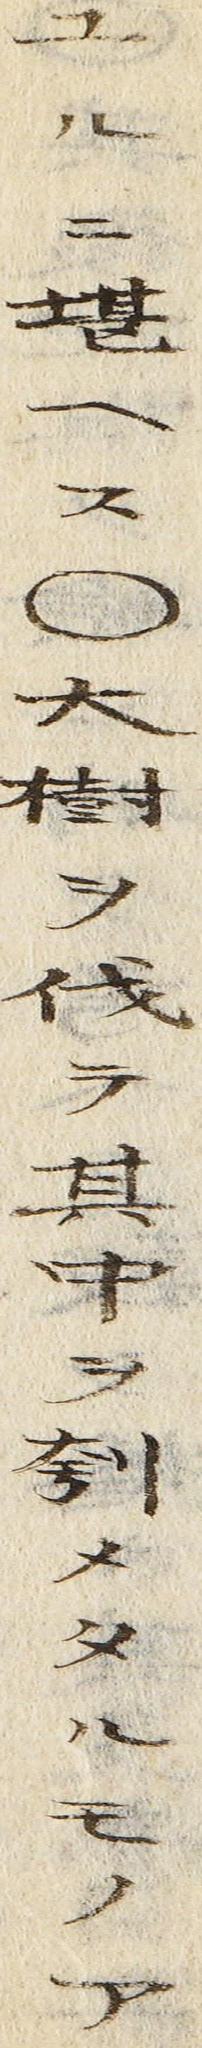ユルニ堪ヘス◯大樹ヲ伐テ其中ヲ刳メタルモノア
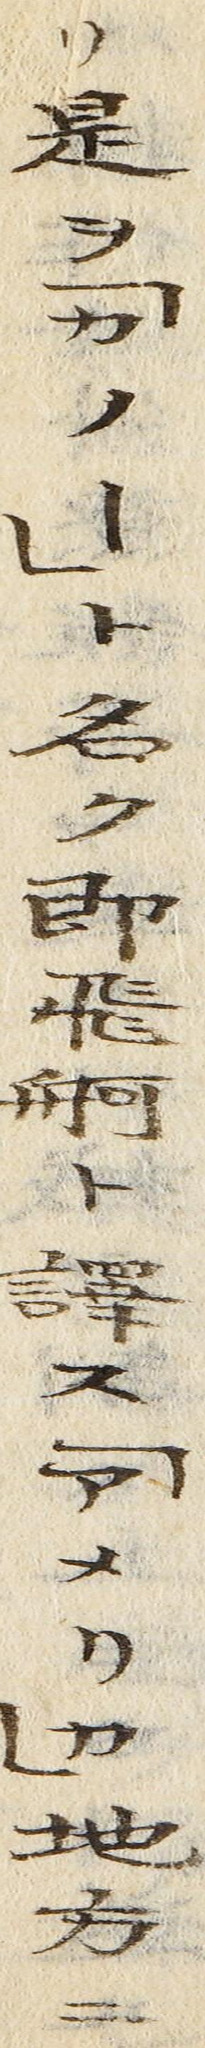リ是ヲ「カノー」ト名ク即飛舸ト訳ス「アメリカ」地方ニ
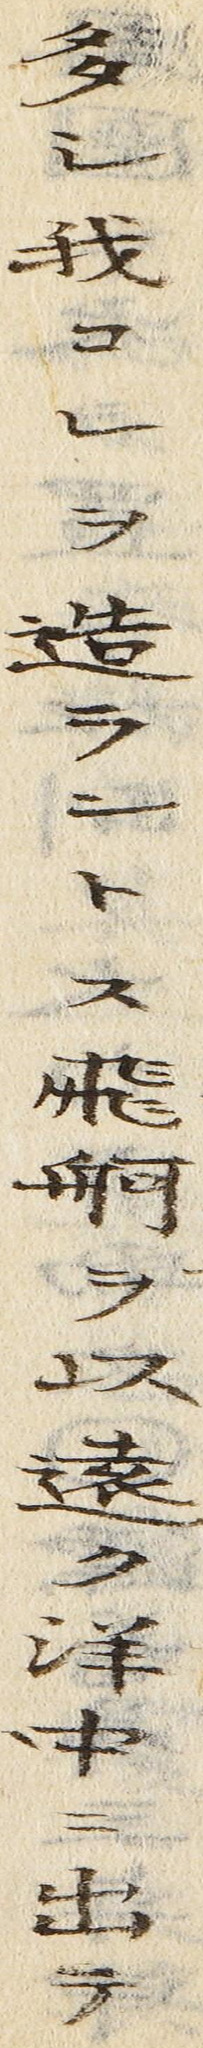多シ我コレヲ造ラントス飛舸ヲ以遠ク洋中ニ出テ
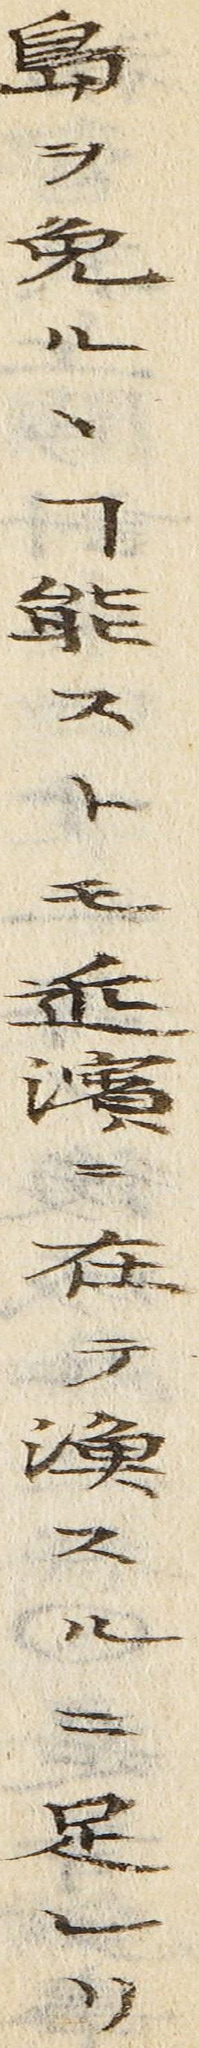島ヲ免ルヽコト能ストモ近浜ニ在テ漁スルニ足レリ
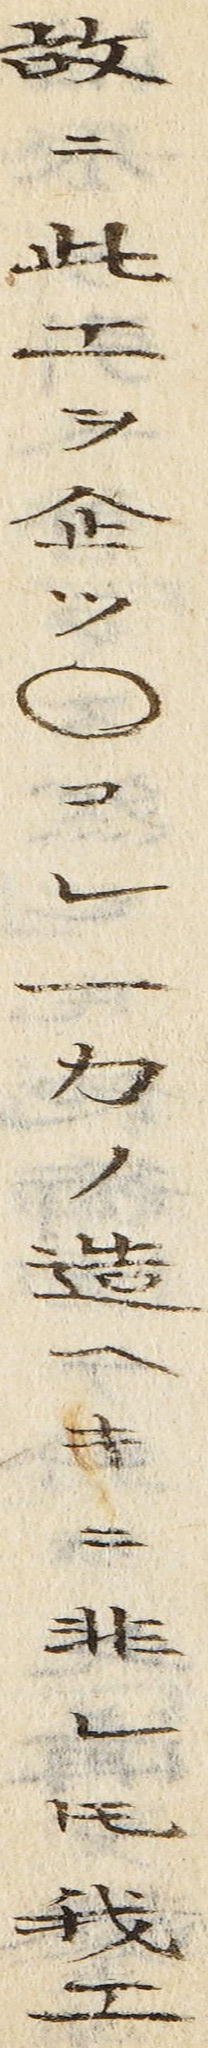故ニ此工ヲ企ツ◯コレ一力ノ造ヘキニ非レトモ我工
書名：漂流紀事
